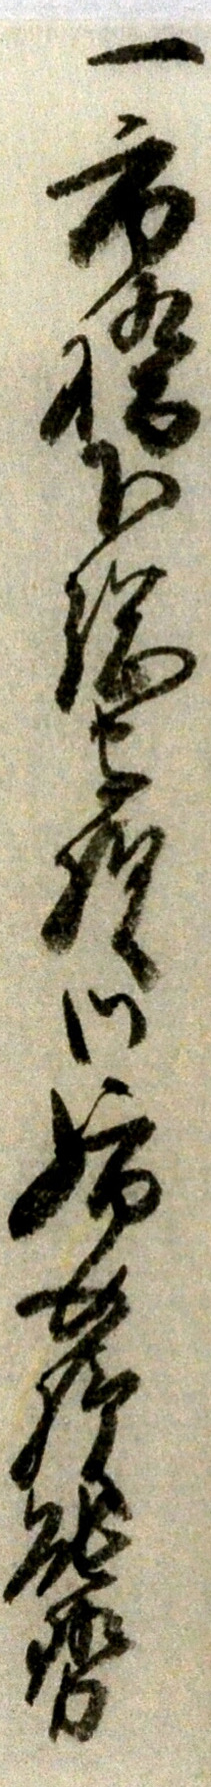一市橋下総守様御姉女様能勢
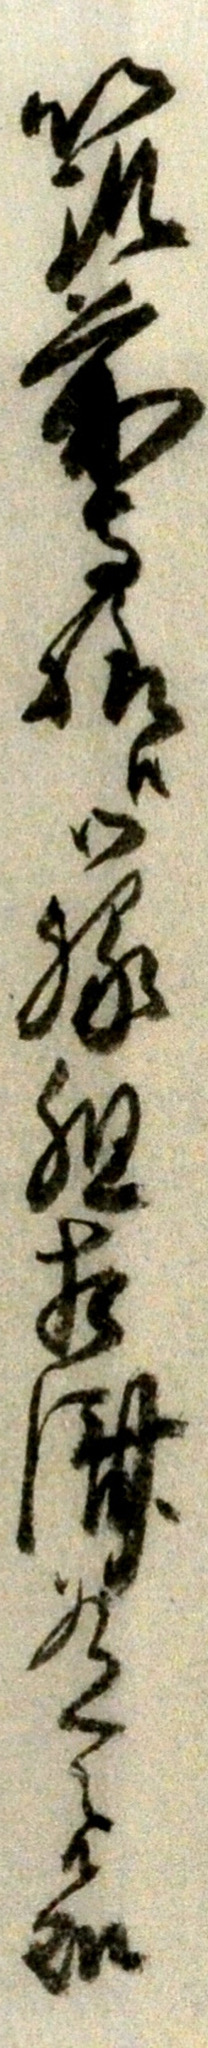筑前守様え御縁組相済有之候処
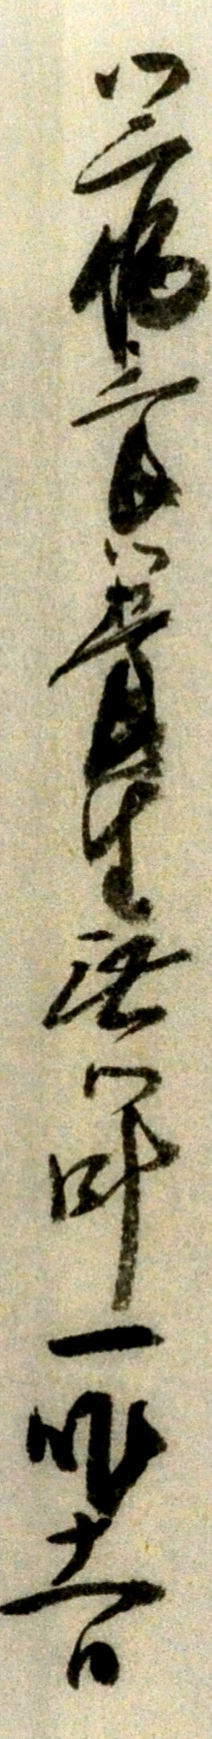御病気御養生無御叶一昨十一日
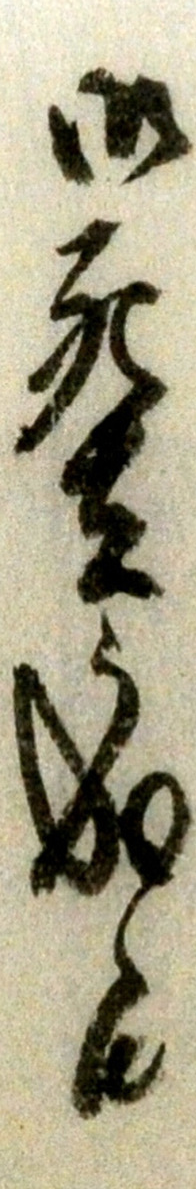御死去被成候由
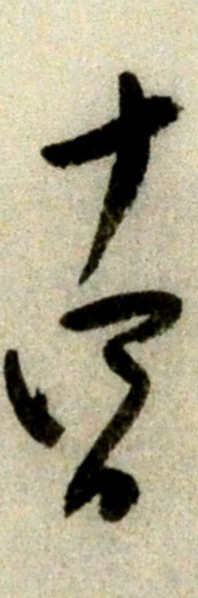十四日
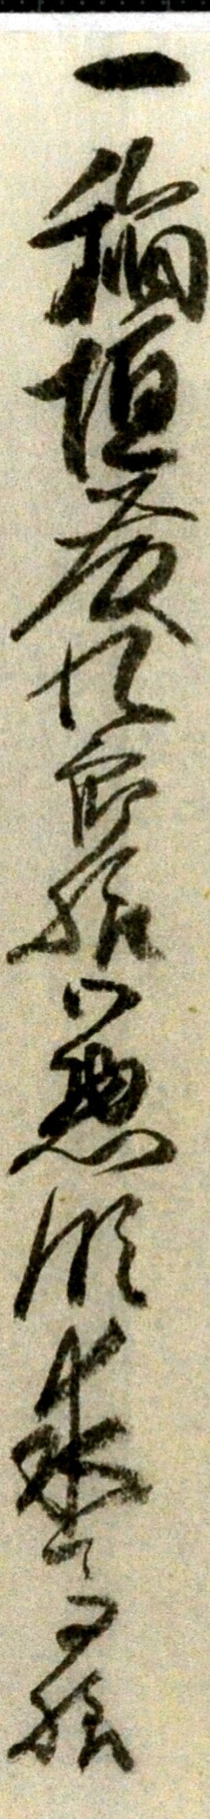一稲垣藤九郎様御惣領求馬様
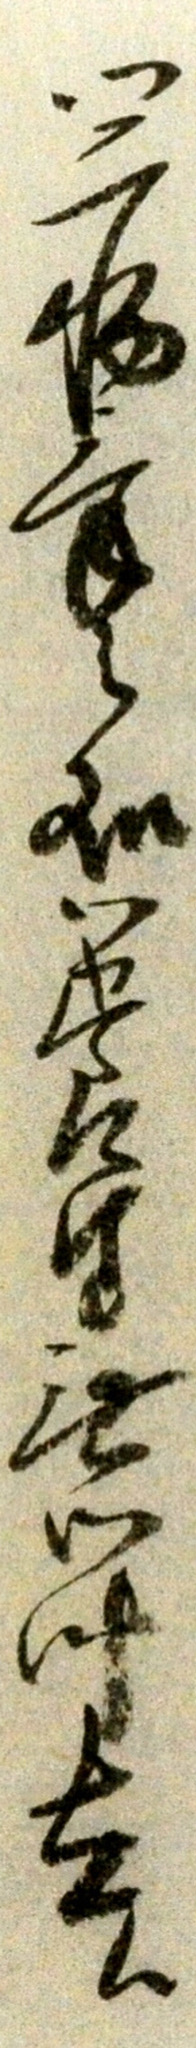御病気之処御養生無御叶去ル
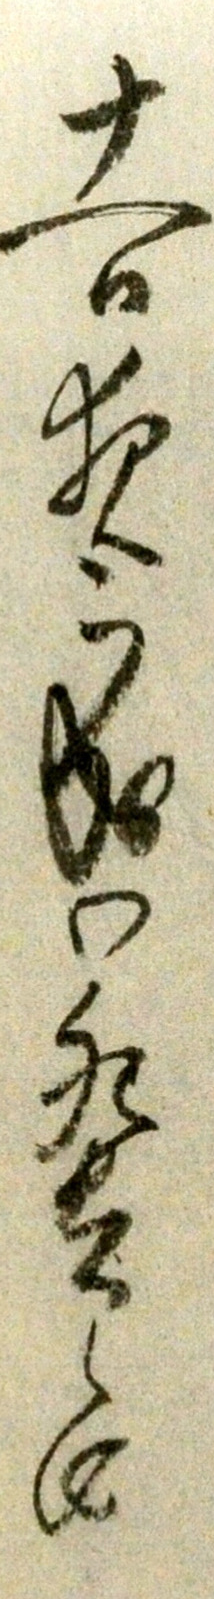十一日夜被成御死去候由
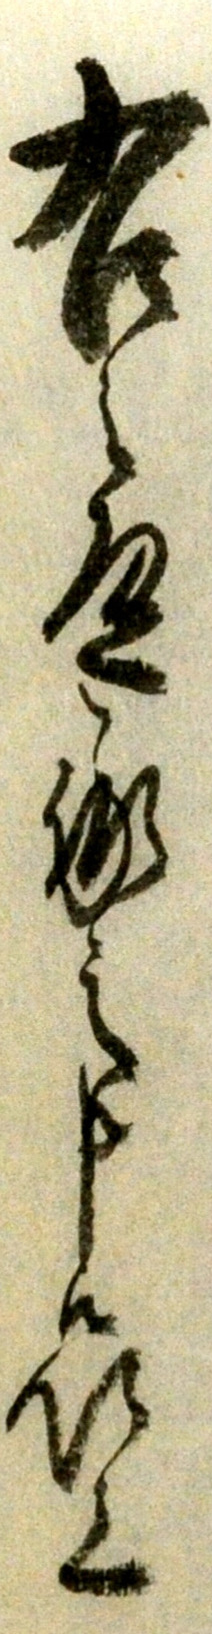右之通承之申候以上
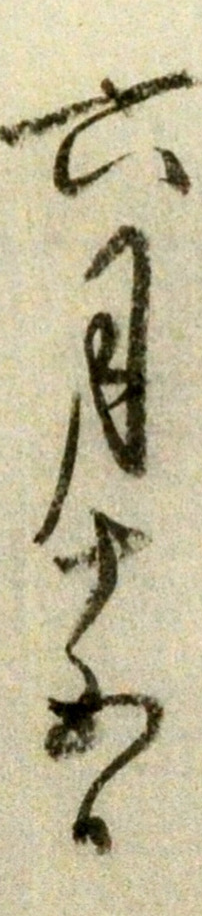六月十五日

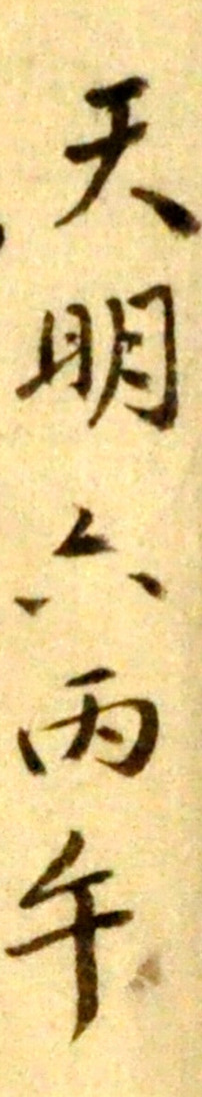天明六丙午
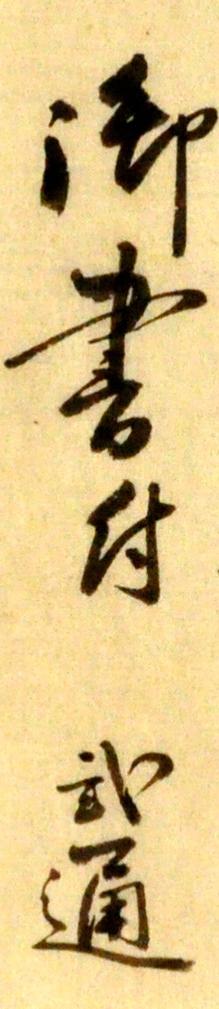御書付弐通

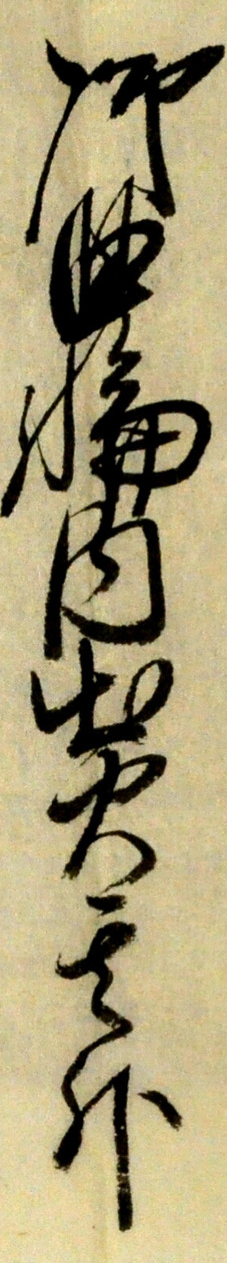御曲輪内出火其外
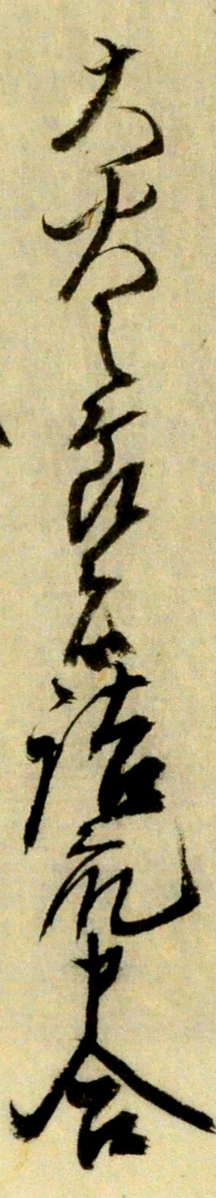大火之節は詰衆申合
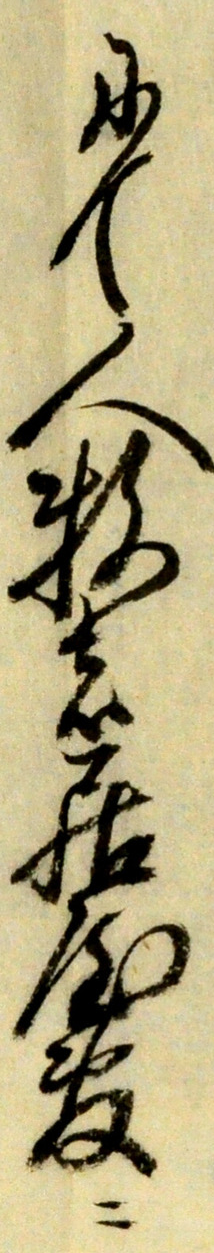にて人数は居屋敷に
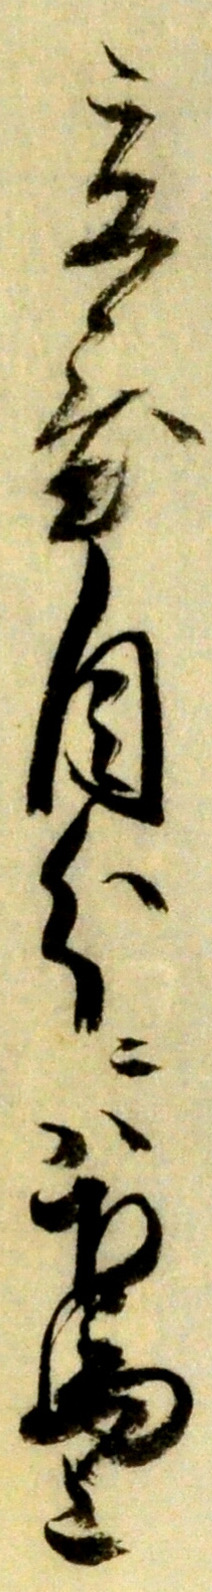立置自分には下馬迄
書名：申合帳〔一括〕
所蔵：伊那市立高遠町図書館・合同会社AMANE
